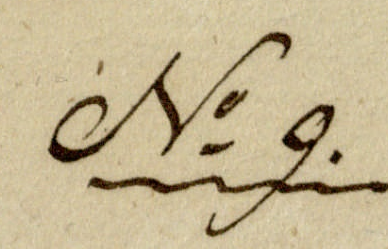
No 9.
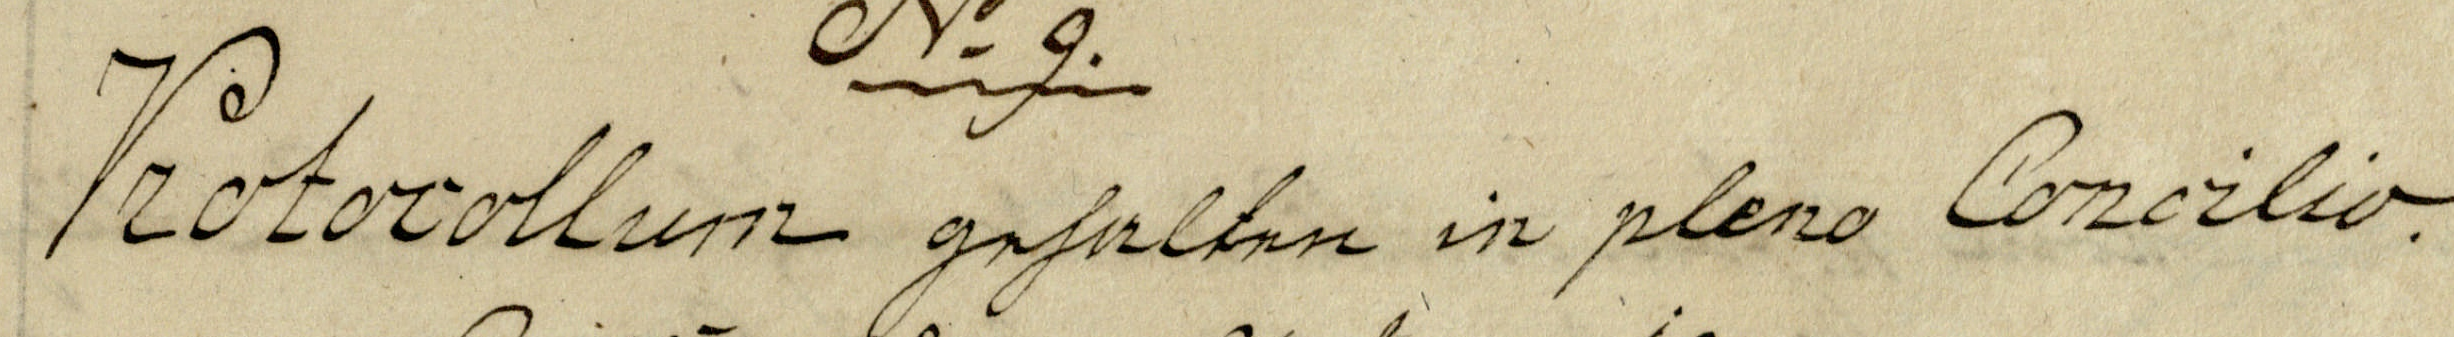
Protocollum gehalten in pleno Concilio.
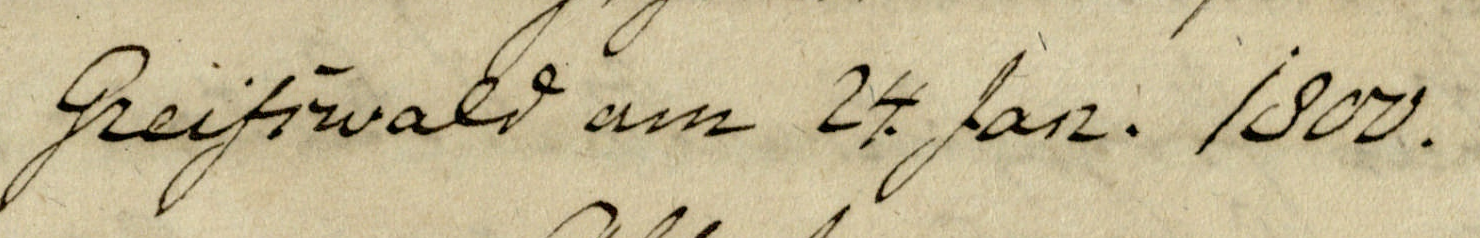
Greifswald am 24 Jan. 1800.
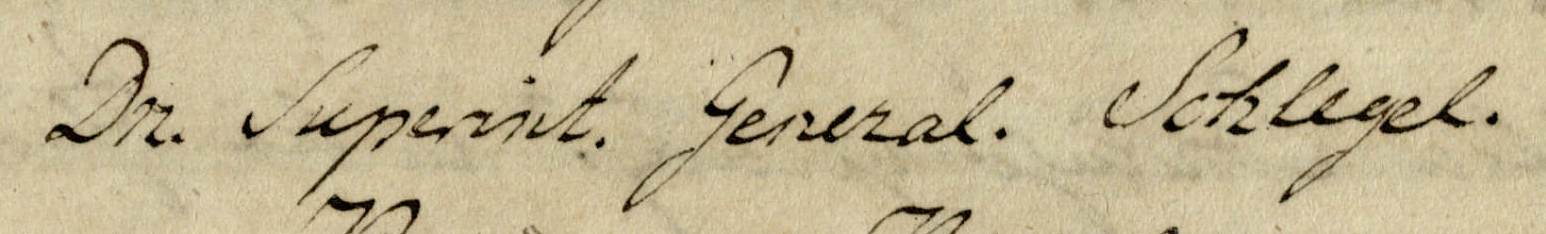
Dn. Superint. General. Schlegel.
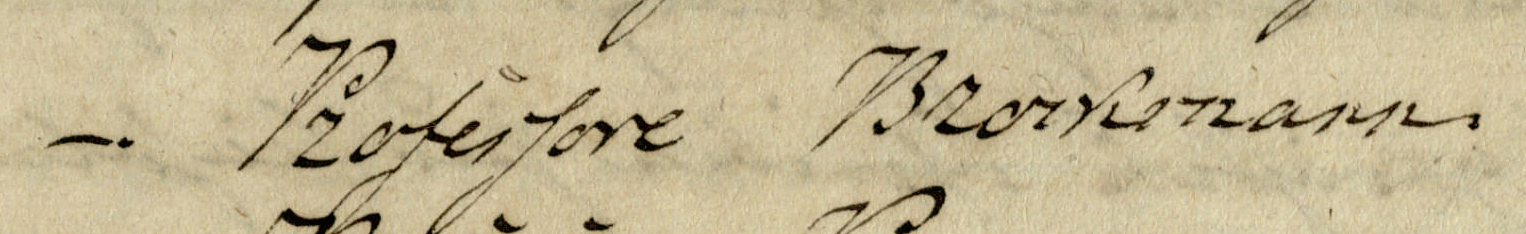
Professore Brockmann.
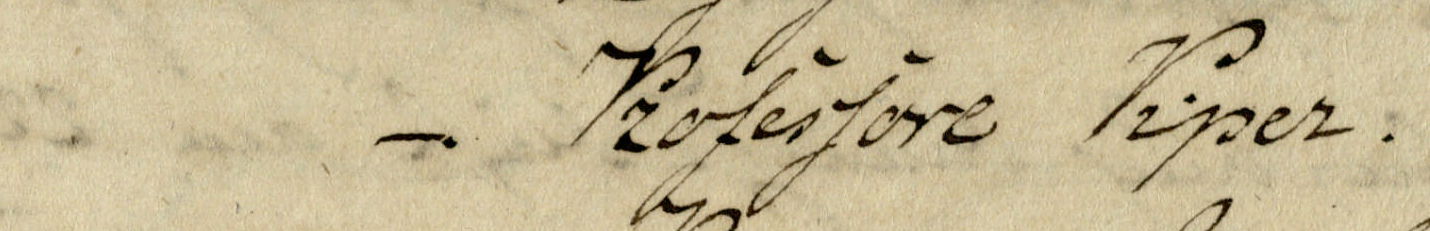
Professore Piper.
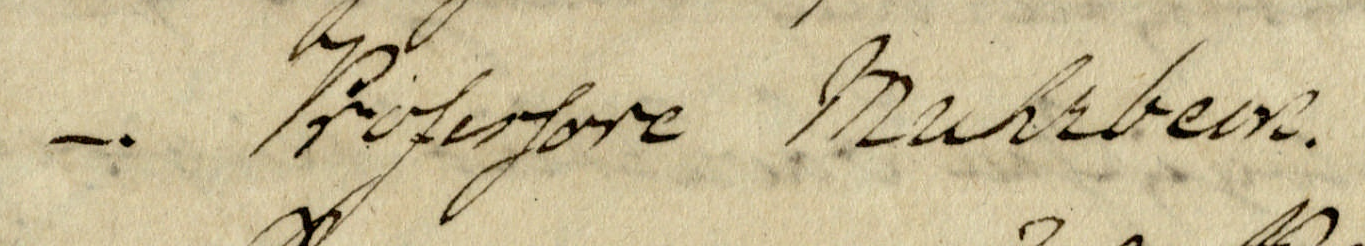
Professore Muhrbeck.
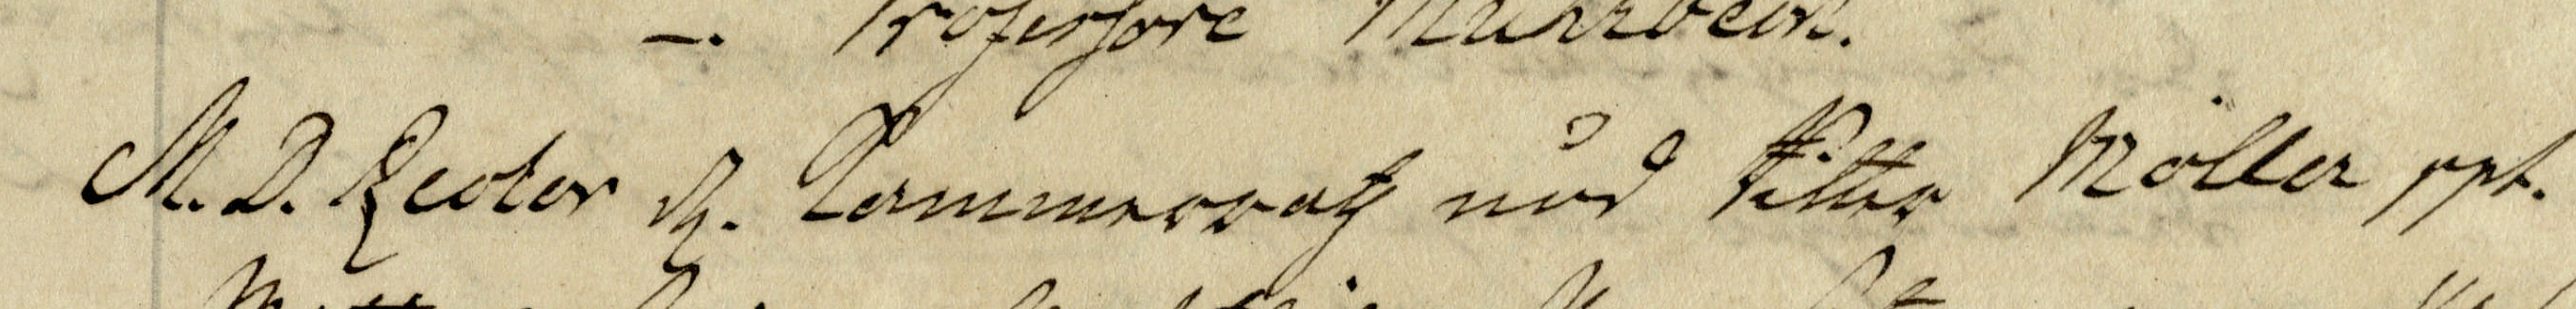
M. D. Rector dh. Kammerrath und Ritter Möller ppt.
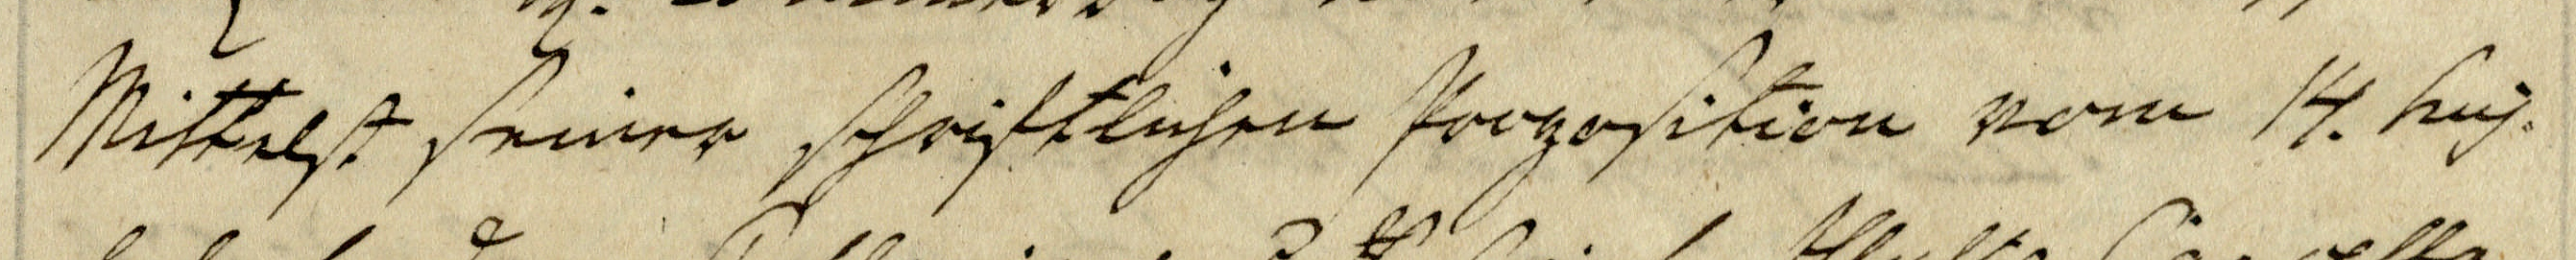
Mittelst seiner schriftlichen Proposition vom 14. huj.
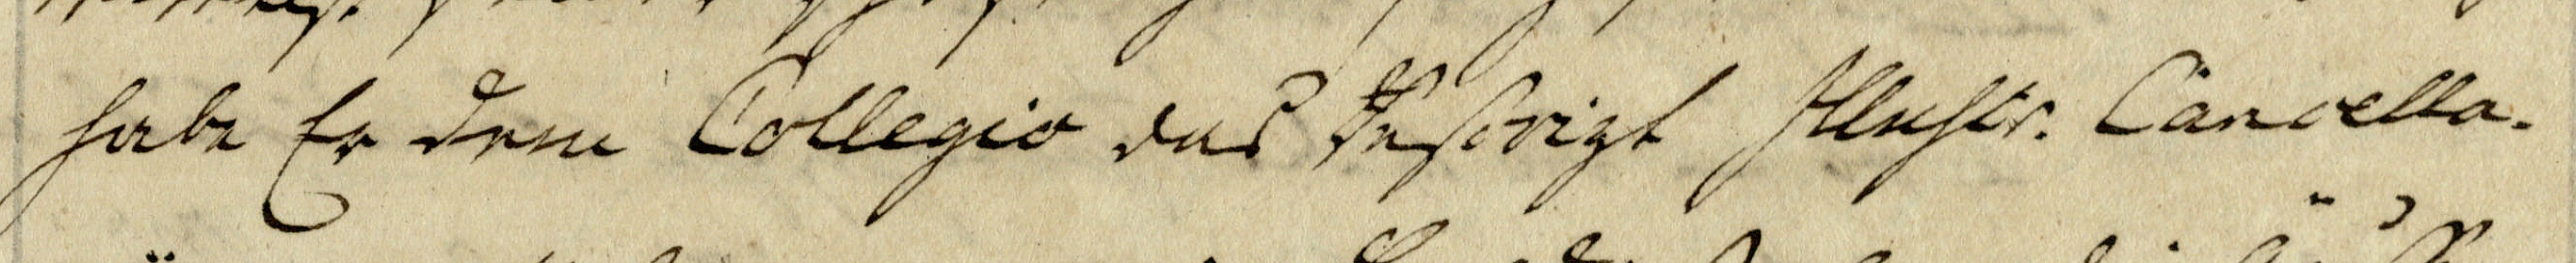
habe Er dem Collegio das Rescript Illustr. Cancella¬
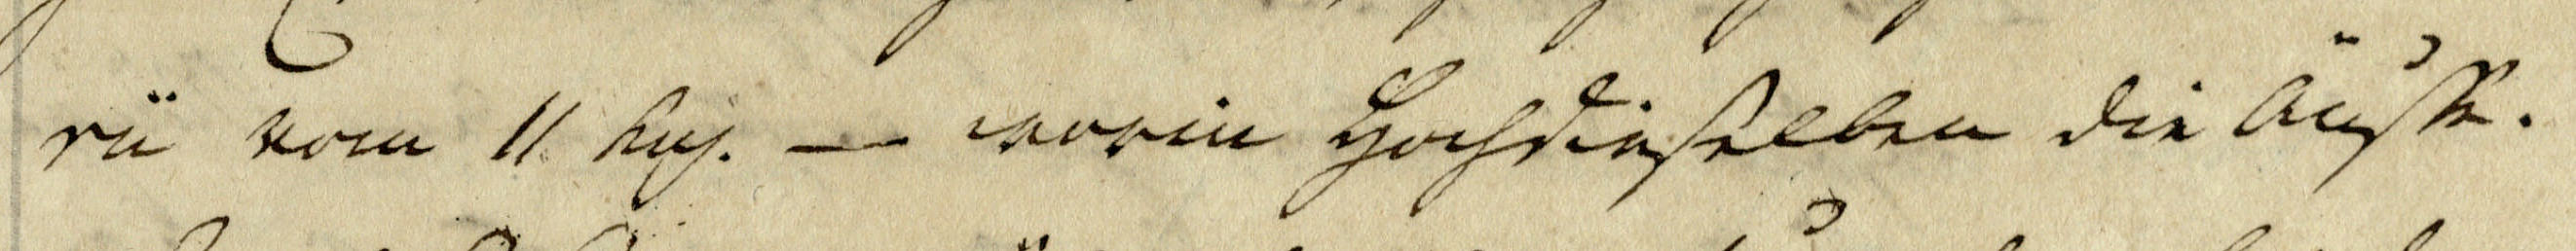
rii vom 11 huj. worin Hochdieselben die Äusse¬
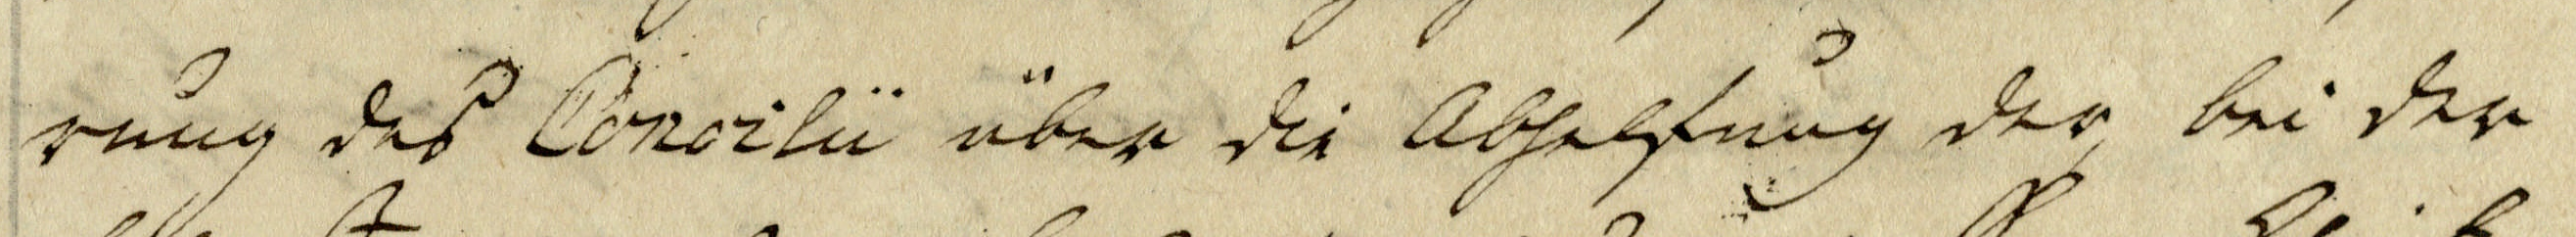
rung des Concilii über die Abhelfung der bei der
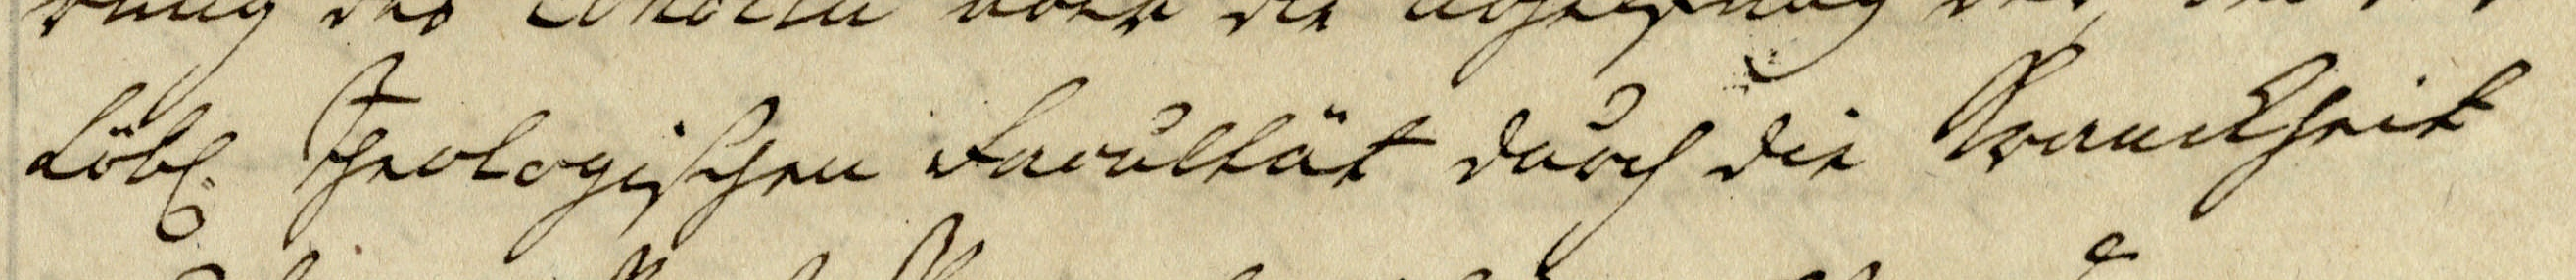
Löbl. Theologischen Facultät durch die Kranckheit
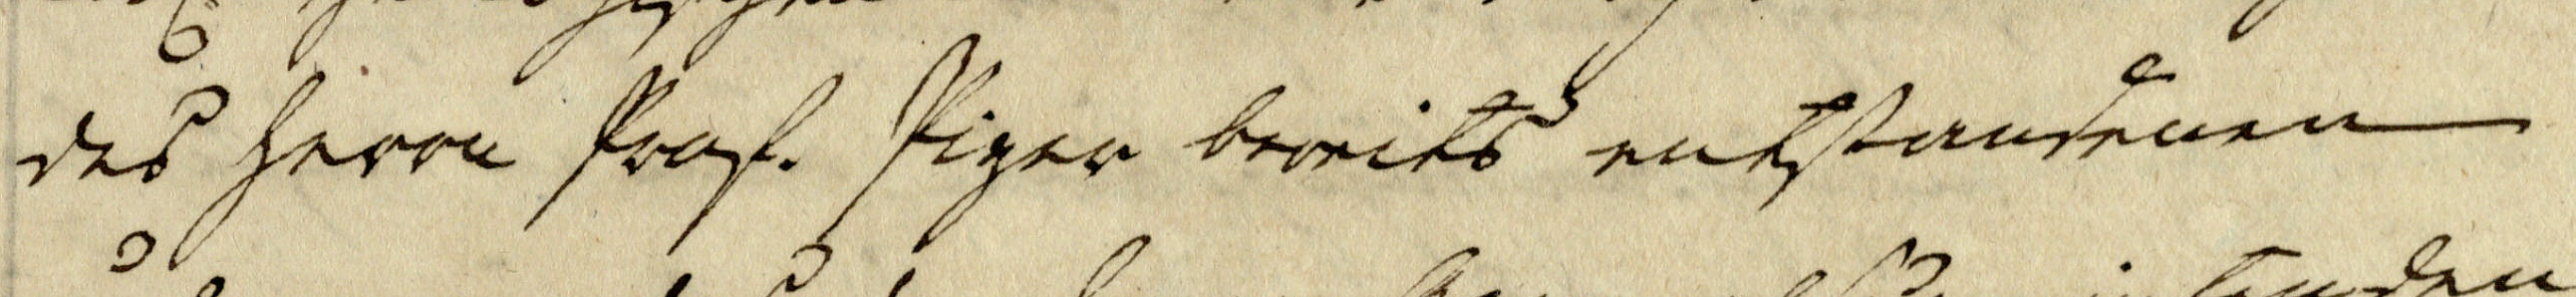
des Herrn Prof. Piper bereits entstandenen
